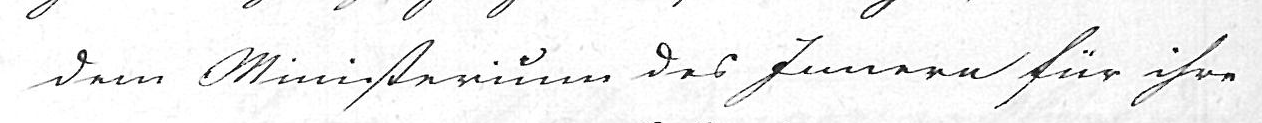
dem Ministerium des Innern für ihre
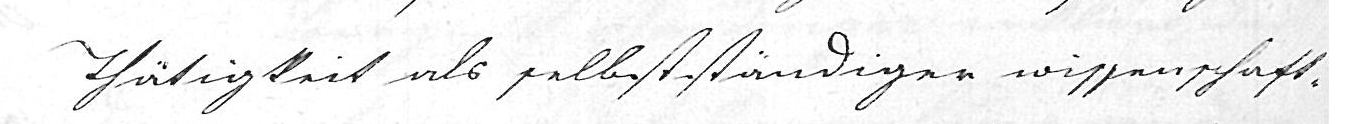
Thätigkeit als selbstständiger wissenschaft-
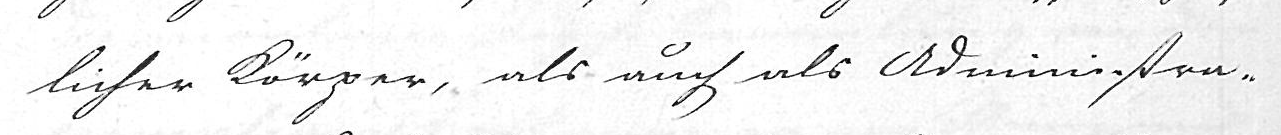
licher Körper, als auch als Administra-
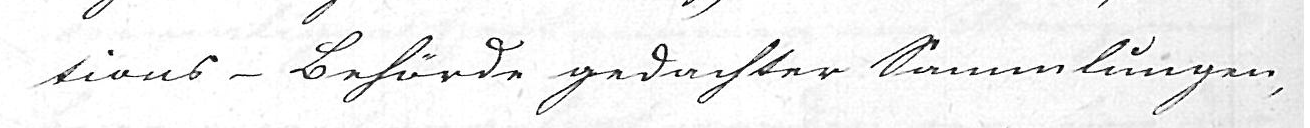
tions-Behörde gedachter Sammlungen,
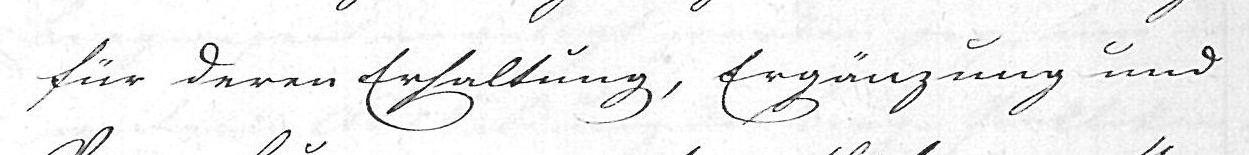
für deren Erhaltung, Ergänzung und
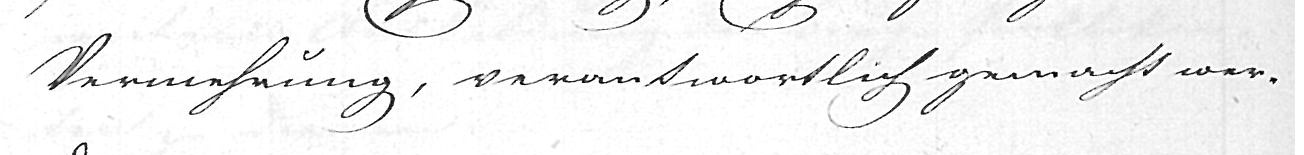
Vermehrung verantwortlich gemacht wer-
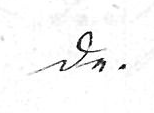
de.
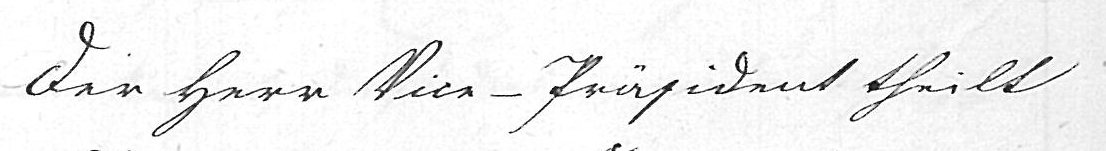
Der Herr Vice-Präsident theilt
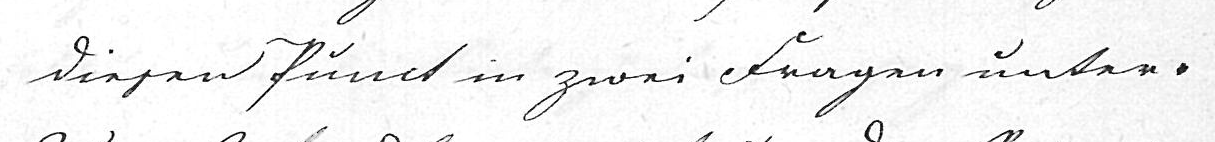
diesen Punct in zwei Fragen unter.
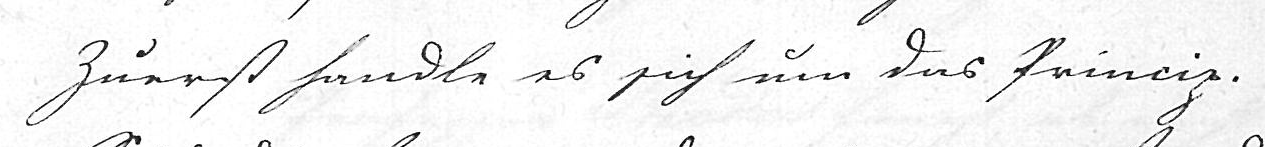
Zuerst handle es sich um das Princip.
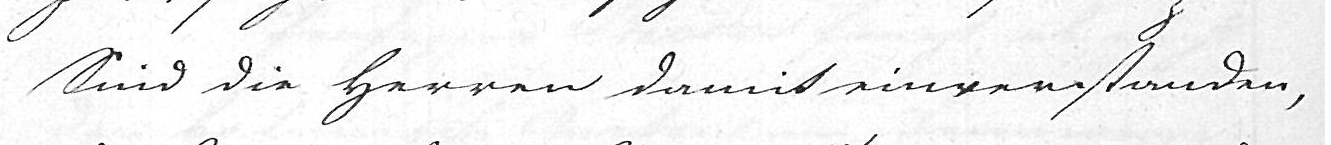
Sind die Herren damit einverstanden,
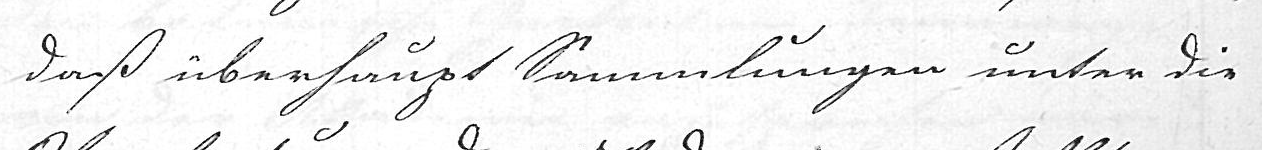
daß überhaupt Sammlungen unter die
